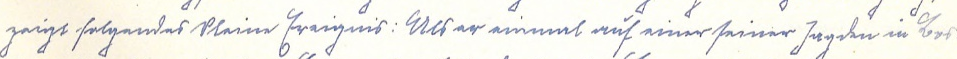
zeigt folgendes kleine Ereignis: Als er einmal auf einer seiner Jagden in Bos-
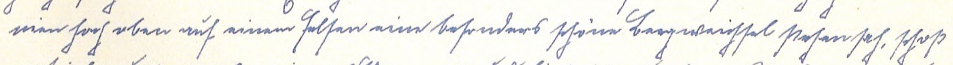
nien hoch oben auf einem Felsen eine besonders schöne Bergweichsel stehen sah, schloß
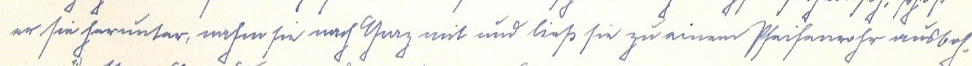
er sie herunter, nahm sie nach Graz mit und ließ sie zu einem Pfeifenrohr ausboh-
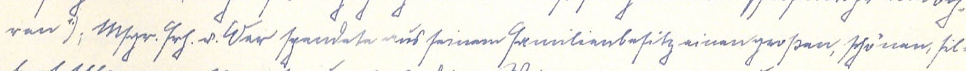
ren1.) Msgr. Frh. w. Wer spendete aus seinem Familienbesitz einen großen, schönen, sil-
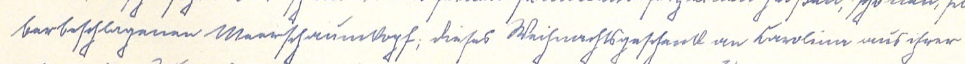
berbeschlagenen Meerschaumkopf; dieses Weihnachtsgeschenck an Carolina aus ihrer
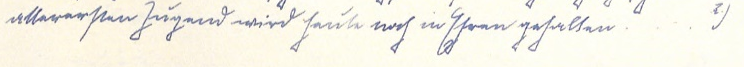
allerersten Jugend wird heute noch in Ehren gehalten.2.)
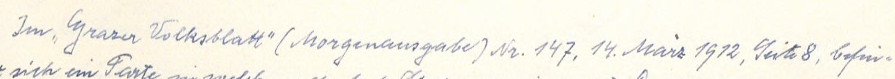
Im "Grazer Volksblatt" (Morgenausgabe) Nr. 147, 14. März 1912, Seite 8, befin-
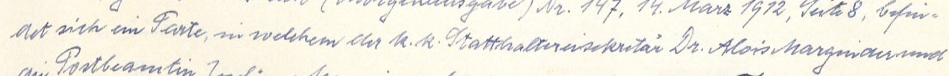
det sich ein Parte, in welchem der k. k. Statthaltereisekretär Dr. Alois XXX
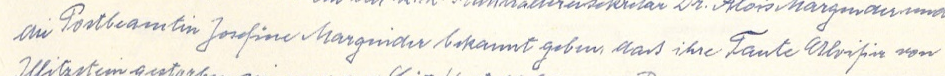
ein Postbeamtin Josefine Margreider bekannt geben, dass ihre Tante Aloisia von
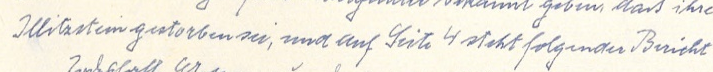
Illitzstein gestorben sei, und auf Seite 4 steht folgender Bericht.
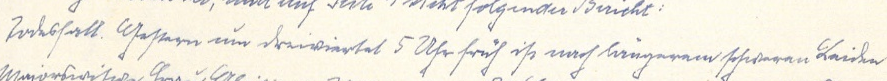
Todesfall. Gestern um dreiviertel 5 Uhr früh ist nach längerem schweren Leiden
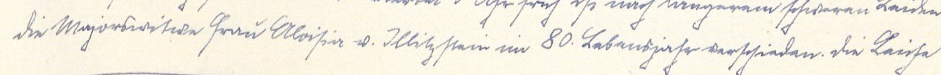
die Majorswitwe Frau Aloisia v. Illitzstein im 80. Lebensjahr verschieden. Die Laiche
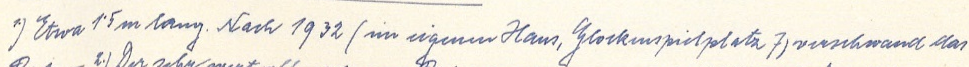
1.) Ewa 15m lang. Nach 1932 (im eigenen Haus, Glockenspielplatz 7) verschwand das
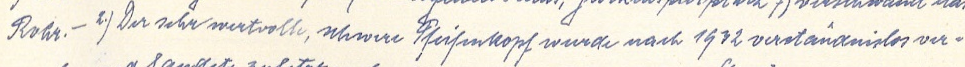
Rohr. - 2.) Der sehr wertvolle, XXX Pfeifenklopf wurde nach 1932 verständnislos ver-
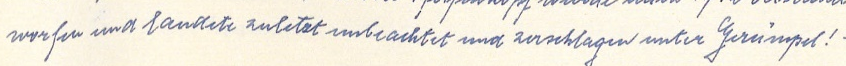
worfen und landete zuletzt unbeachtet und zerschlagen unter Gerümple! -
